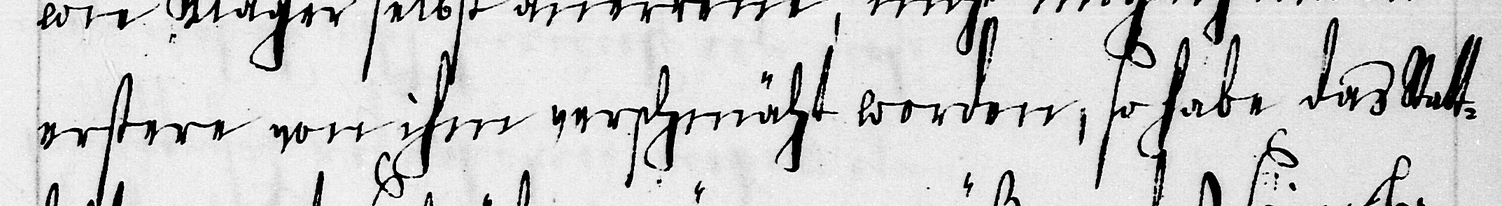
erstere von ihm verschmäht worden, so habe das Stat¬
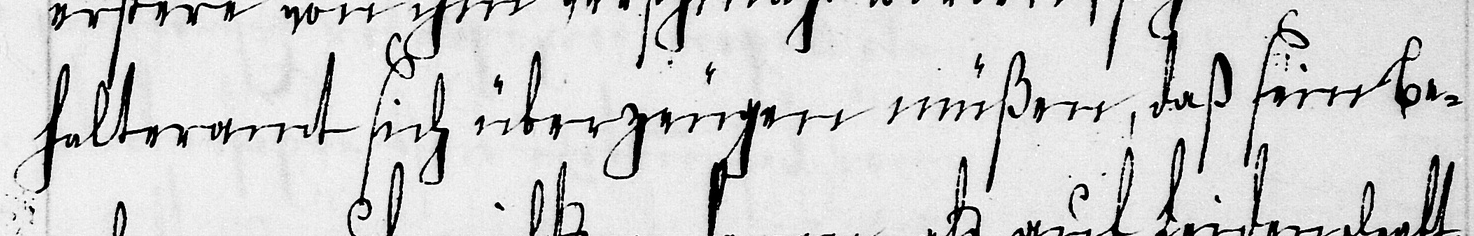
thalteramt sich überzeugen müßen, daß sein Be¬
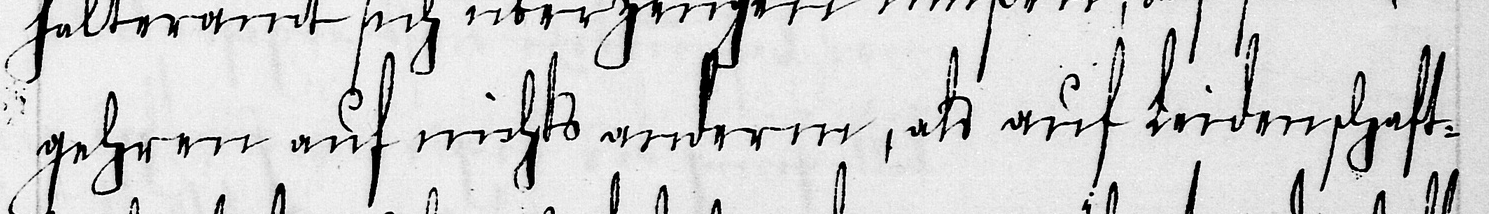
gehren auf nichts anderm , als auf Leidenschaft¬
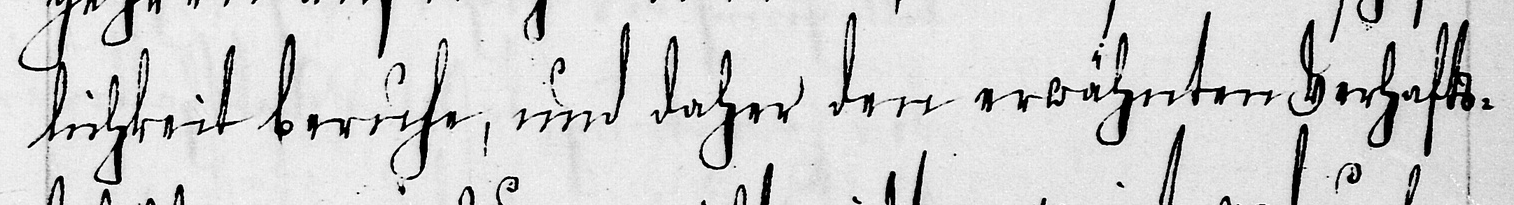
lichkeit beruhe, und daher den erwähnten Verhafts¬
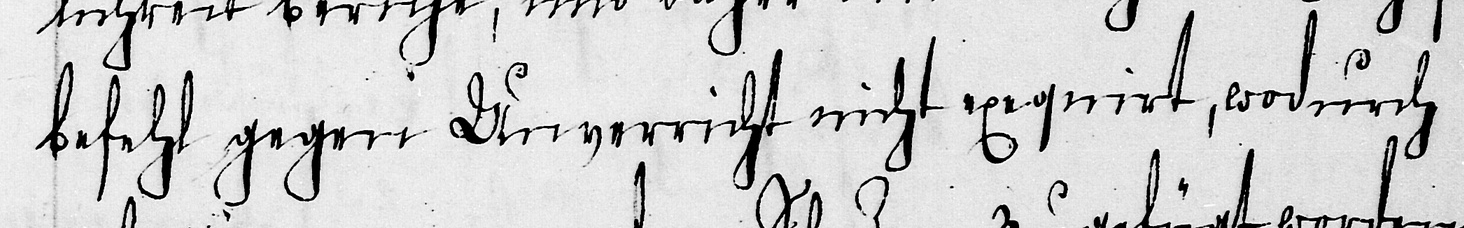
befehl gegen Unverricht nicht exequirt, wodurch
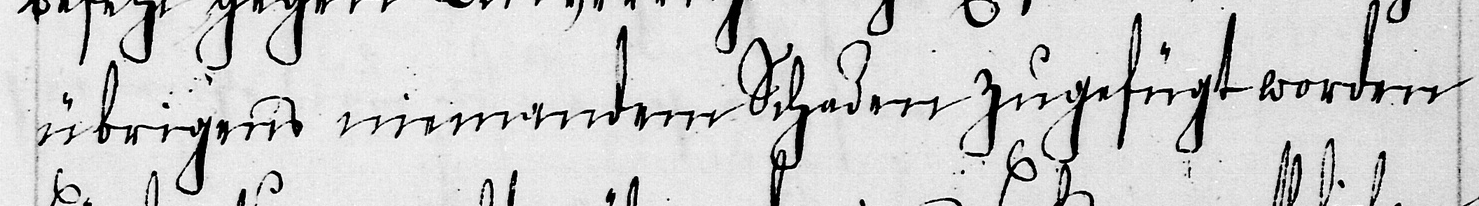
übrigens niemandem Schaden zugefügt worden
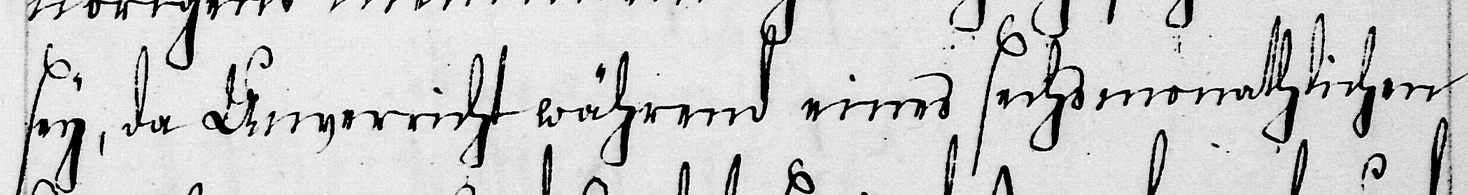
sey, da Unverricht während eines sechsmonathlichen
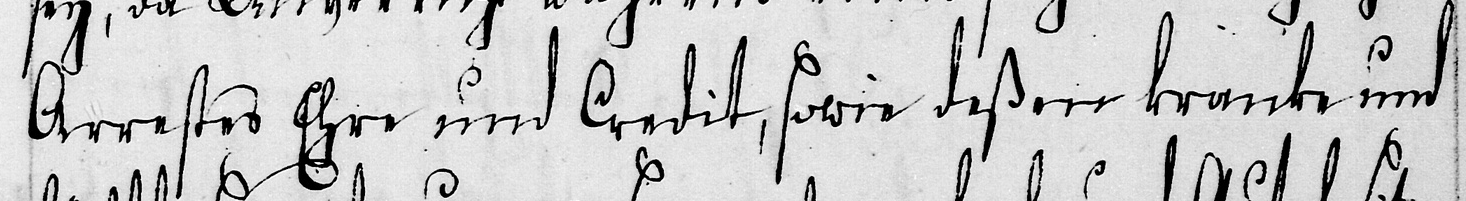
Arrestes Ehre und Credit, sowie deßen kranke und
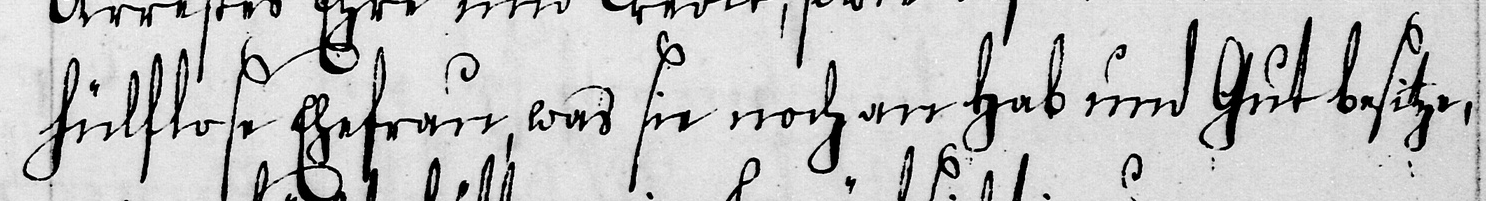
hülflose Ehefrau, was sie noch an Hab und Gut besitz¬
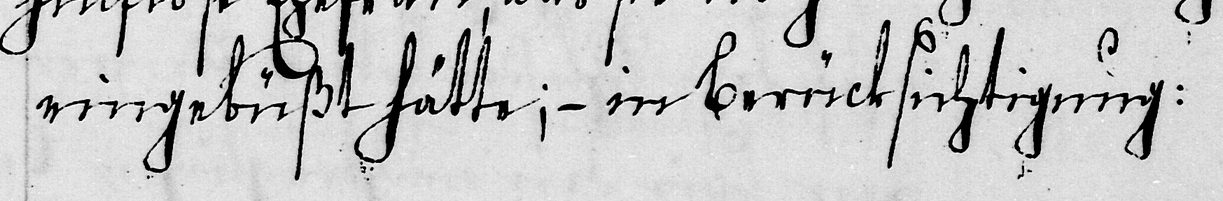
eingebüßt hätte; – in Berücksichtigung:
